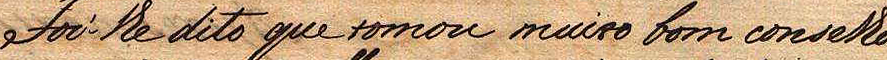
Foi-lhe dito que tomou muito bom conselho
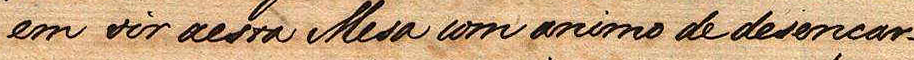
em vir a esta Mesa com animo de desencar
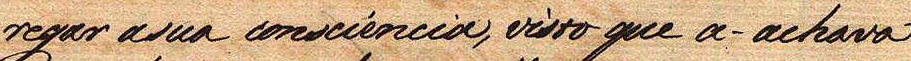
regar a sua consciencia, visto que a-achava
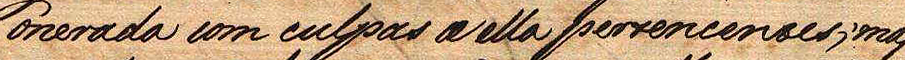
onerada com culpas a ella pertencentes; mas
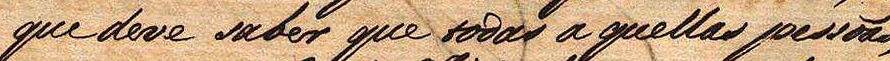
que deve saber que todas aquellas pessoas,
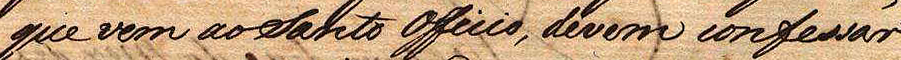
que vem ao Santo Officio, devem confessar
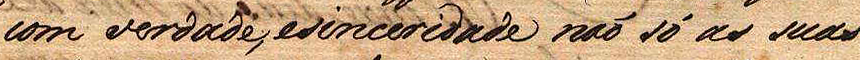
com verdade, e sinceridade naõ só as suas
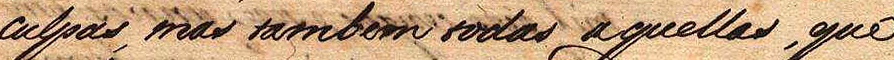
culpas, mas tambem todas aquellas, que
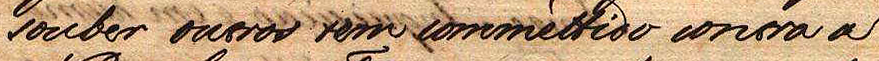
souber outros tem commettido contra a
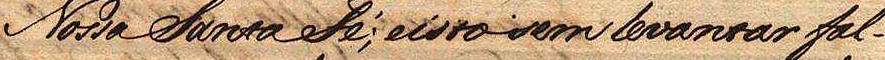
Nossa Santa Fé; e isso sem levantar fal
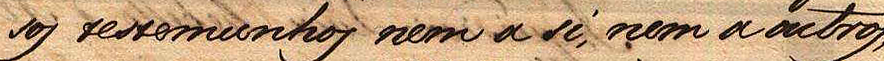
sos testemunhos nem a si, nem a outros,
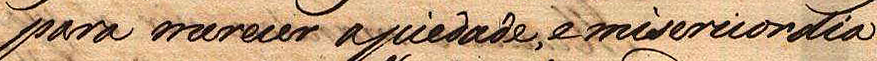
para merecer a piedade, e misericordia
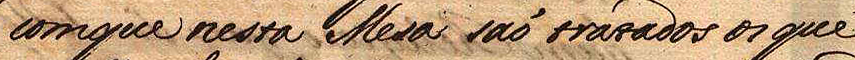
com que nesta Mesa saõ tratados os que
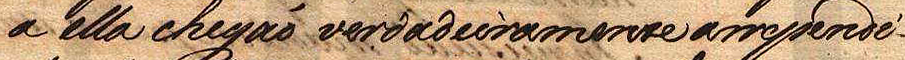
a ella chegaõ verdadeiramente arrependi
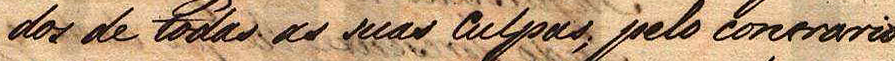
dos de todas as suas culpas; pelo contrario
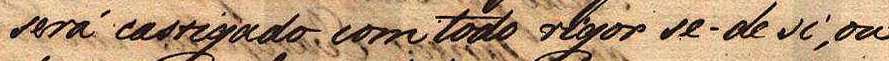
será castigado com todo rigor se-de si, ou
